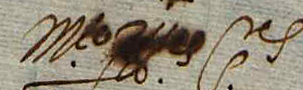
M.to Jll.es S.res
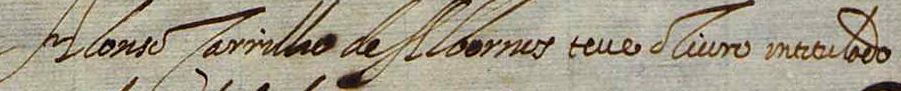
Alonso Carrilho de Albornos teue o liuro intitulado
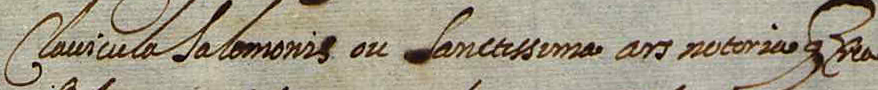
Clauicula Salomonis ou Sanctissima ars notoria q̄ Crea
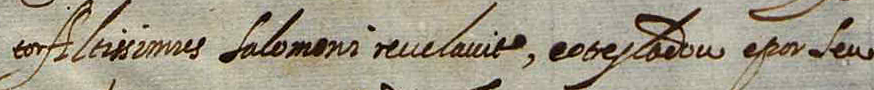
tor Altissimus Salomoni reuelauit, e o tresladou e por seu
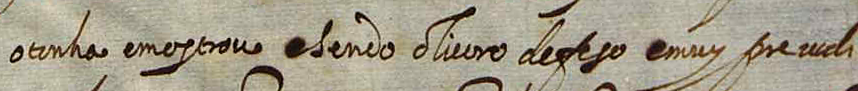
o tinha e mostrou e sendo o liuro defeso e muy preiudi
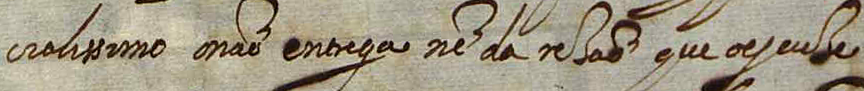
cialissimo o naõ entrega nē da rezaõ que o escuze
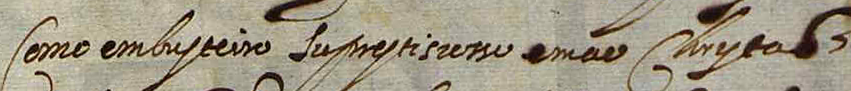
Como embusteiro suprestisiosso e mao Christaõ
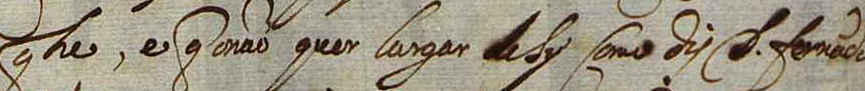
q̄ he, e q̄ o naõ quer largar de sy Como dis D. fernādo
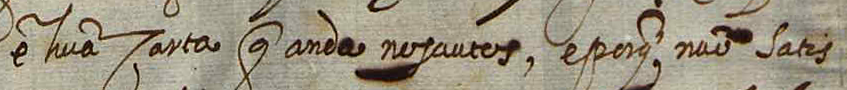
ē huā Carta q̄ anda nos autos, e porq̄ naõ satis
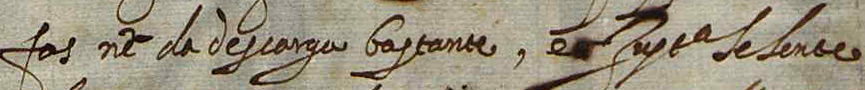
fas nē da descarga bastante, e a Justa se sente
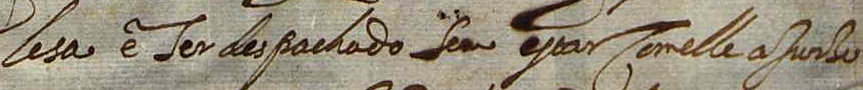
lesa ē ser despachado sem estar Com elle a Juizo
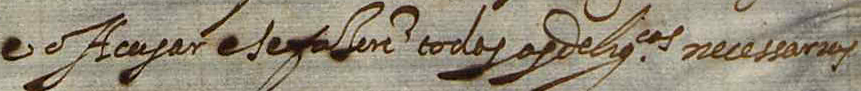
e o Acusar e se fazerē todas as delig.ças necessarias
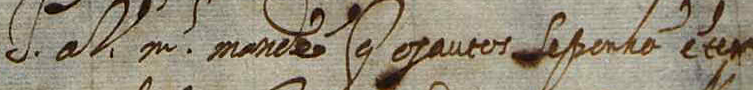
P. a V.s m.s mandē q̄ os autos se ponhā ē ter
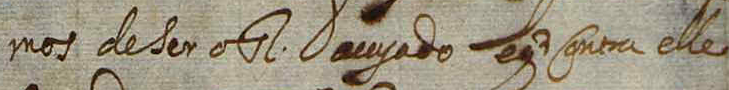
mos de ser o R. acusado e q̄ Contra elle
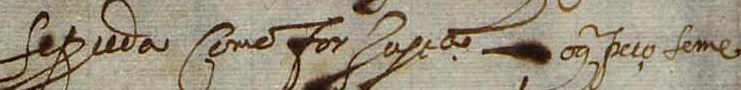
se ꝓceda Como for Just.a - o q̄ peço se me
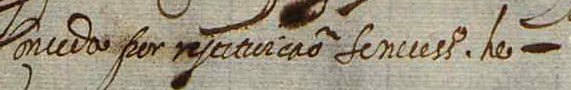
Conceda por restituiçaõ se necesso. he -
